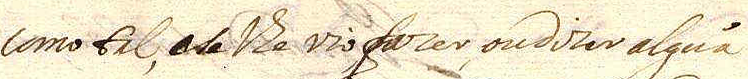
como tal, e se lhe vio, fazer, ou dizer alguā
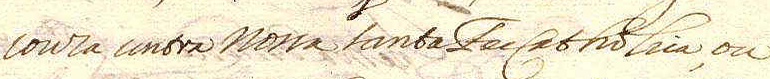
couza contra Nossa santa Fee Catholica, ou
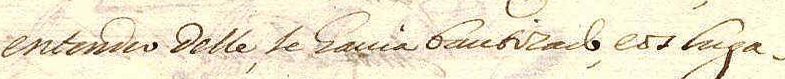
entendeo delle, se hauia bautizado, e os luga
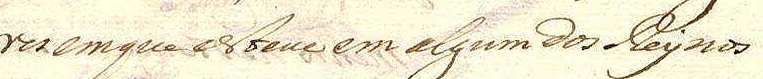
res em que os teue em algum dos Reynos
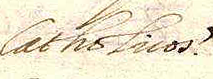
Catholicos?
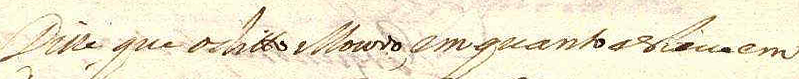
Disse, que o ditto Mouro, emquanto esteue em
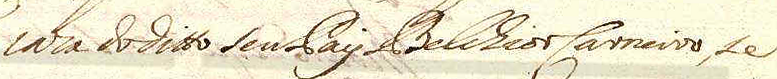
caza do ditto seu Pay Belchior Carneiro, se
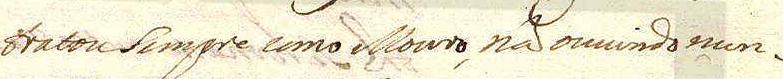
tratou sempre como Mouro, naõ ouuindo nun
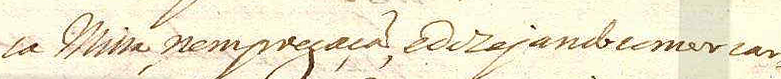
ca Missa, nem pregaçaõ, e dezejando comer car
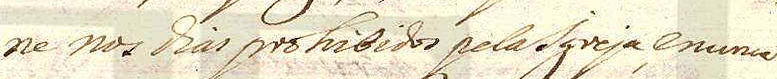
ne nos dias prohibidos pela Igreja, e nunca
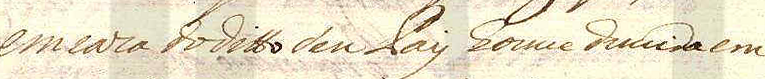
em caza do ditto seu Pay houue duuida em
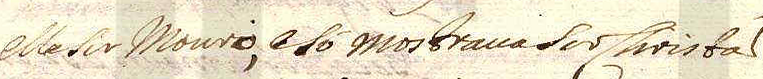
elle ser Mouro, e só mostraua ser Christaõ
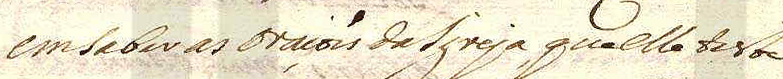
em saber as oraçoẽs da Igreja, que elle teste
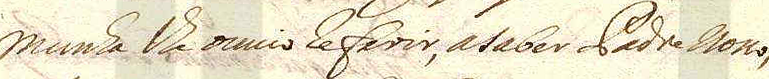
munha lhe ouuio Referir, a saber Padre nosso,
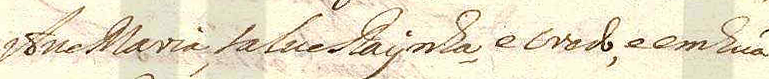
Aue Maria, salue Raynha, e credo, e em huā
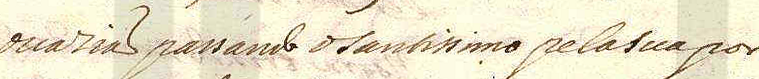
occaziaõ passando o santissimo pela sua por
